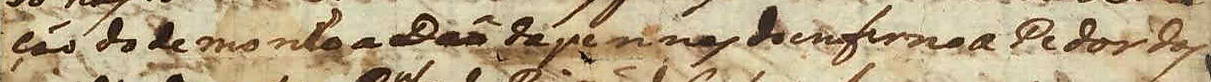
çaõ do demonho aDaõ da pennas do inferno a Pedor das
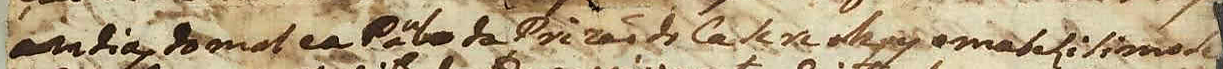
andias do mal e a Paulo da Prizaõ do Casere olhpes amabeLisimo se
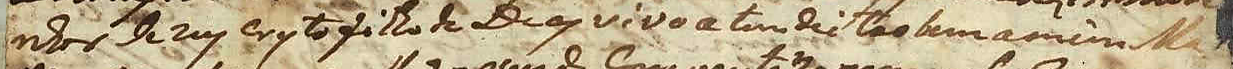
nhor Iezus cristo filho de Deos vivo atemdei taobem a mim Mar
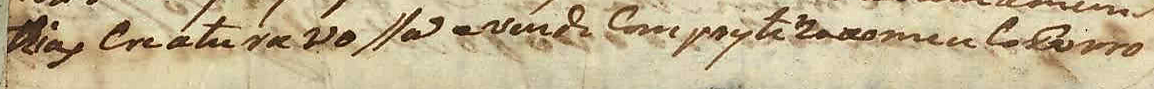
thias Creatura vossa avendo Compresteza ao meu CoCorro
